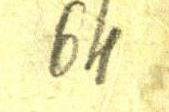64
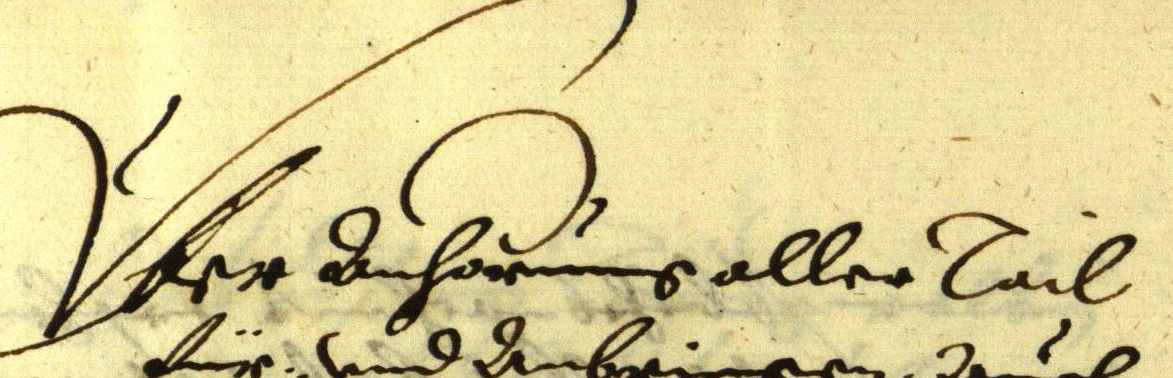V̄ber Anhōrūng aller Tail
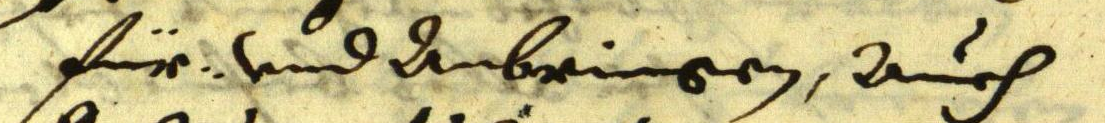für: vnd Anbringen, Aūch
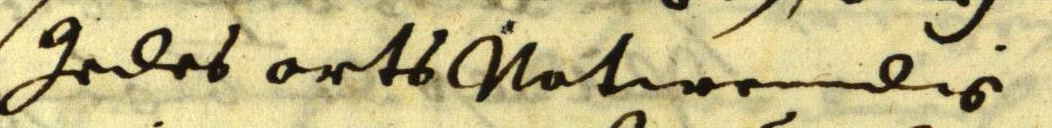Jedes orts Notwenndig
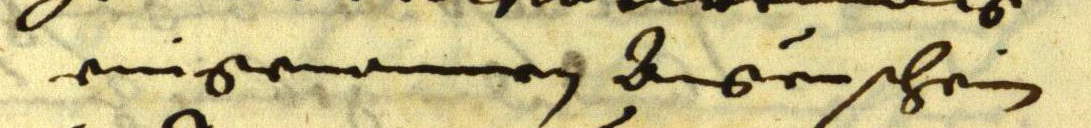Eingenommen Aūgenschein
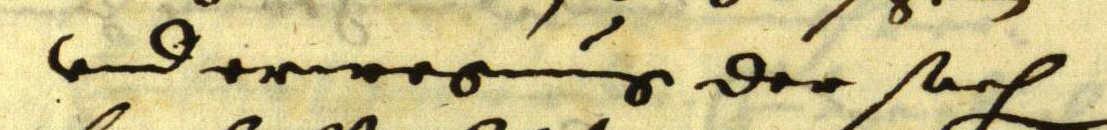vnd erwegūng der sach
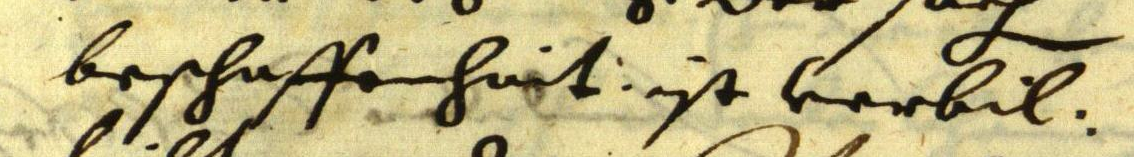beschaffenhait. ist verbil¬
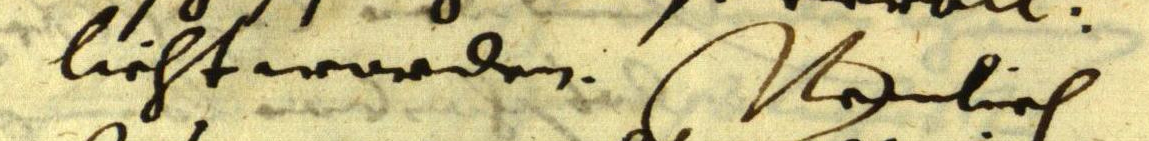licht worden. Nemlich
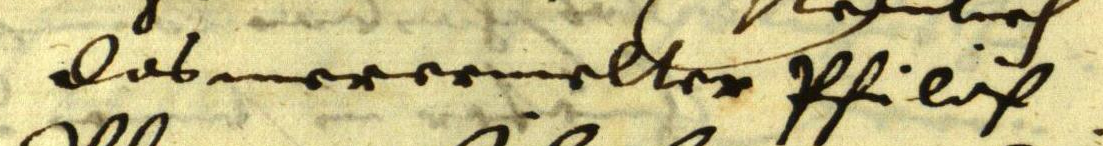das merermelter Pfilip
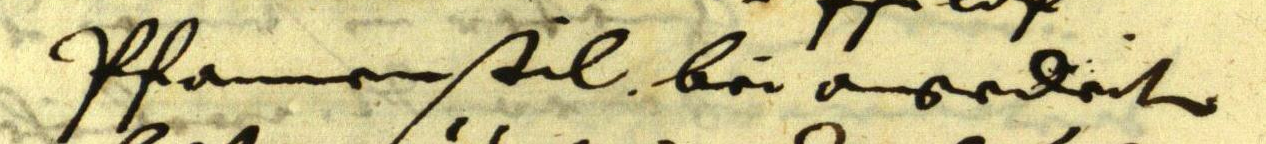Pfannenstil. bei angedeit
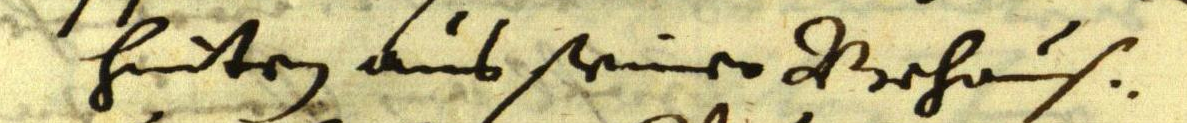hinten aūs seiner Behaūs¬
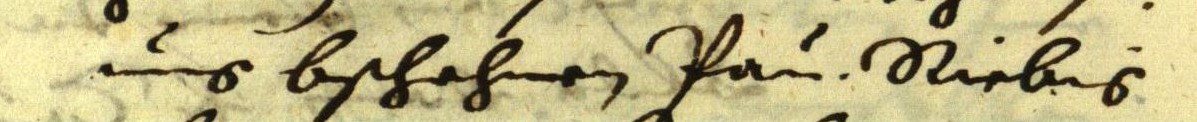ūng beschehnen Paū. Riebig
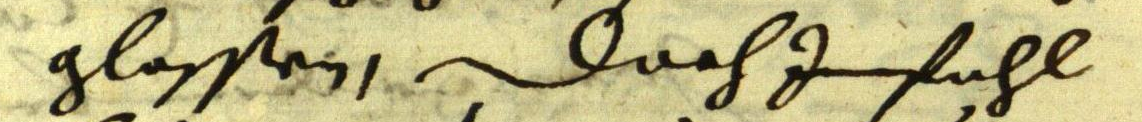glassen, doch Innfahl
